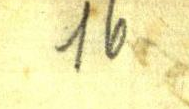16
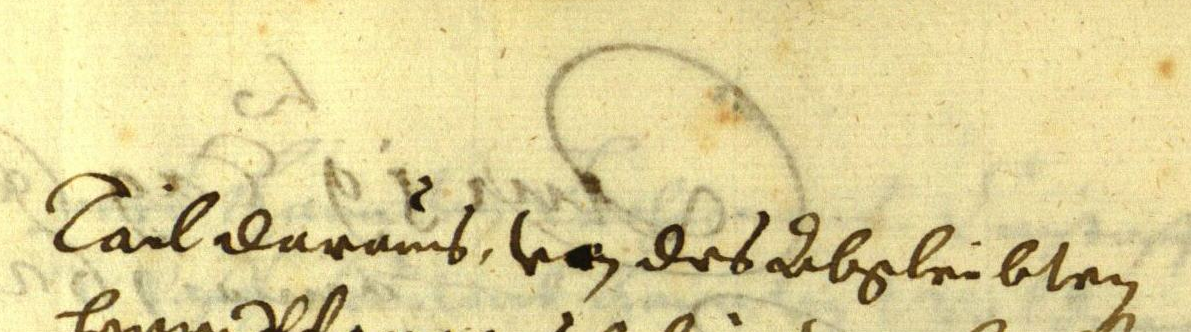Tail daraūs. von des Abgleibten
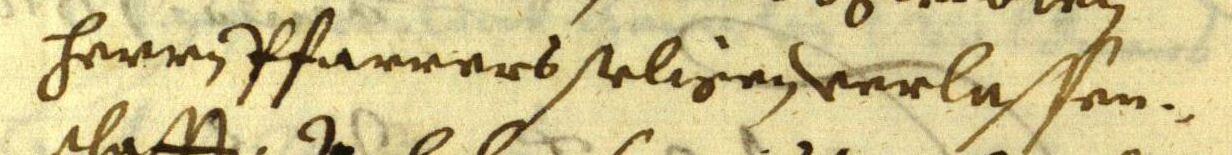herrn Pfarrers seligen verlassen¬
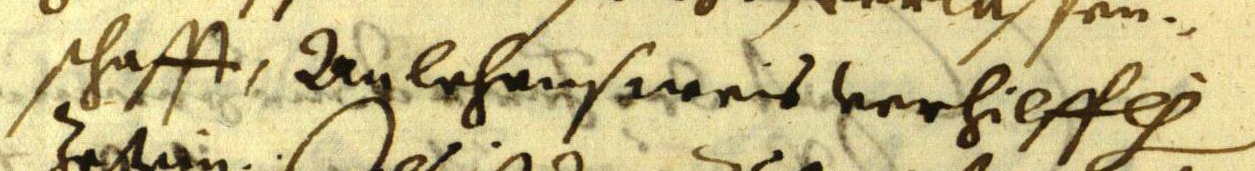schafft, Anlehensweis verhilfflich
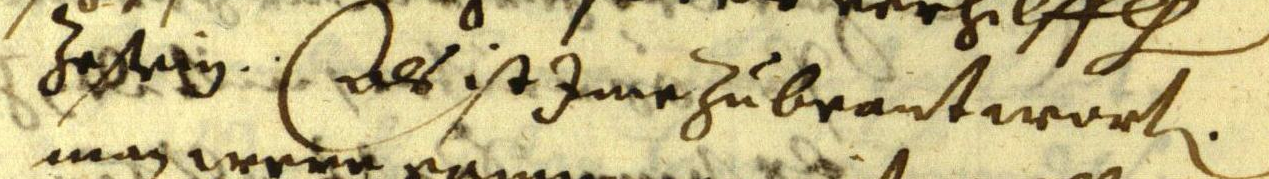Ze sein. Als ist Ime Zū beantwort.
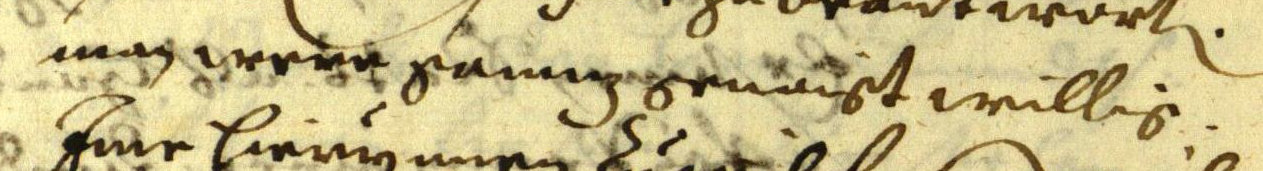man were gannz genaigt willig
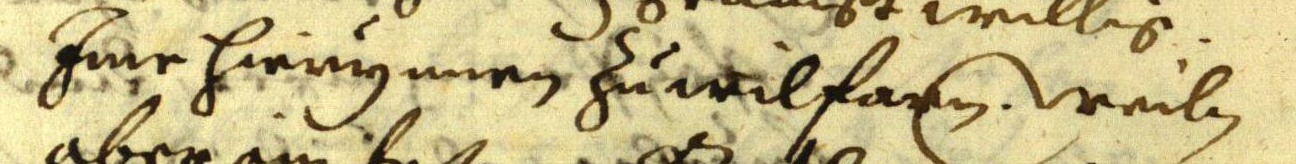Ime hierȳnnen Zū wilfarn. Weiln
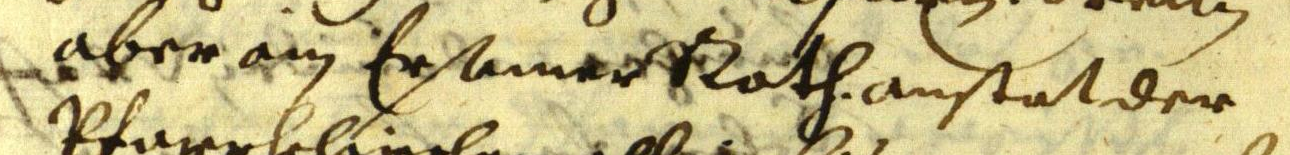aber ain Ersamer Rath. anstat der
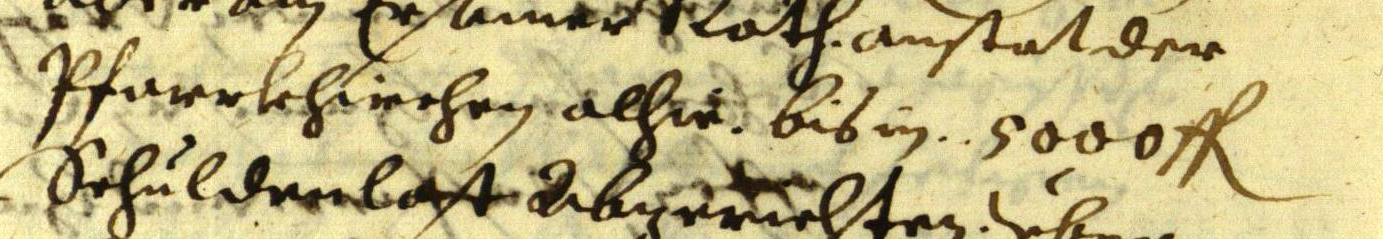Pfarrkhirchen alhie. bis in: 5000 fl.
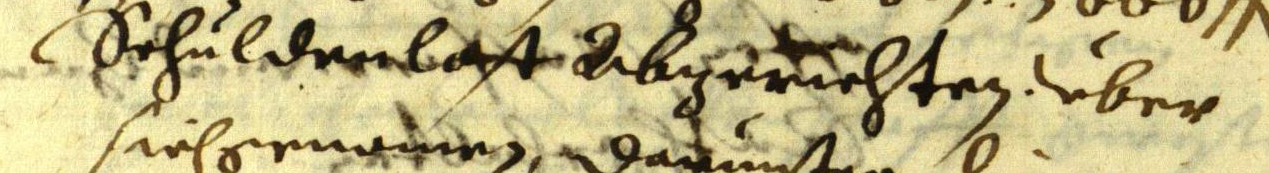Schūldenlast Abzerichten. v̄ber
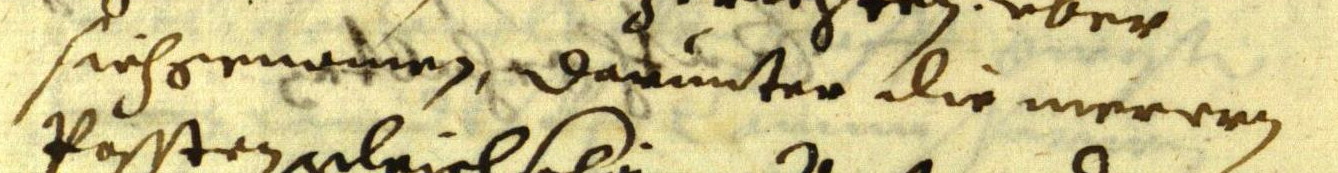sich genomen, darūnter die merern
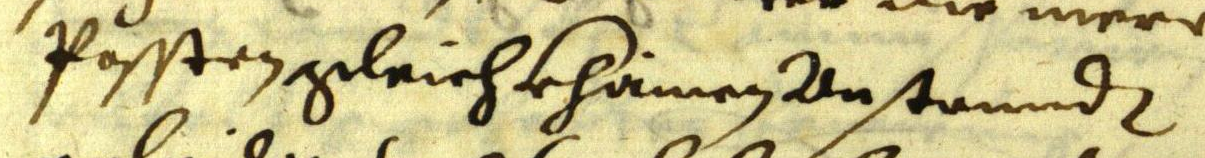Possten gleich khainen Anstanndt
